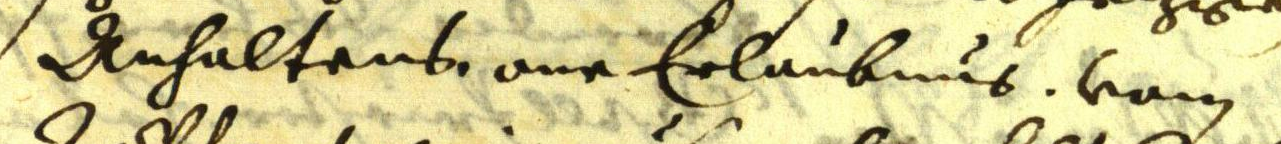Anhaltens one Erlaūbnūs. vom
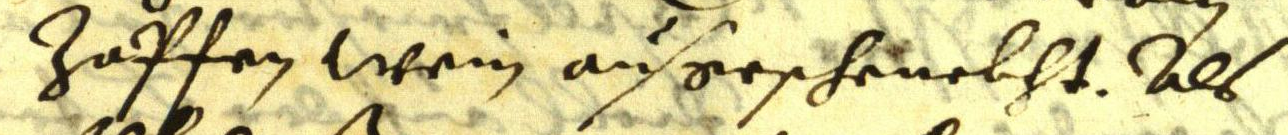Zapfen Wein aūsgeschenckht. Als
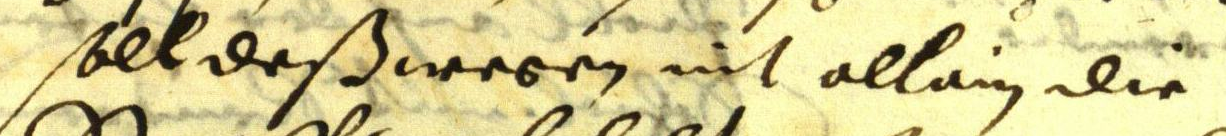soll deßwegen nit allain die
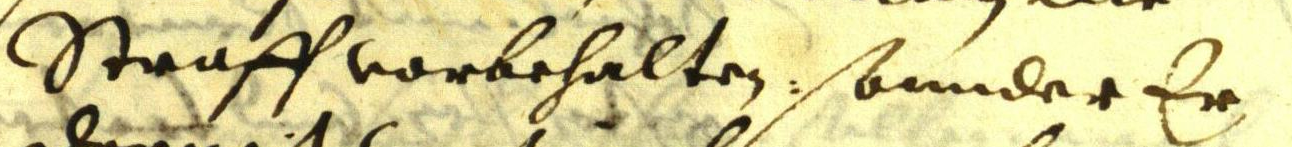Straff vorbehalten. sonder Er
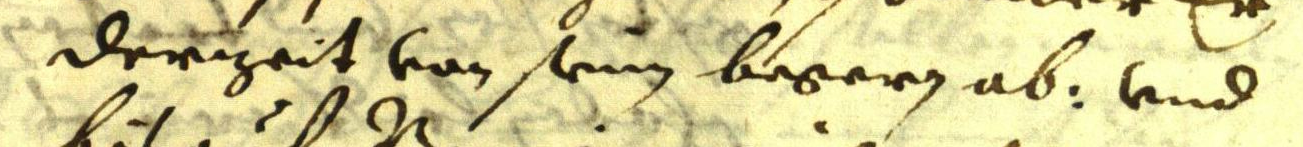derzeit von sein begern ab: vnd
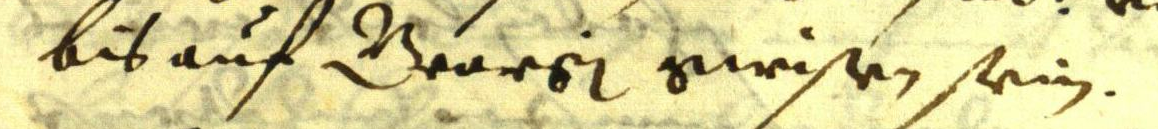bis aūf Georgj gwisen sein.
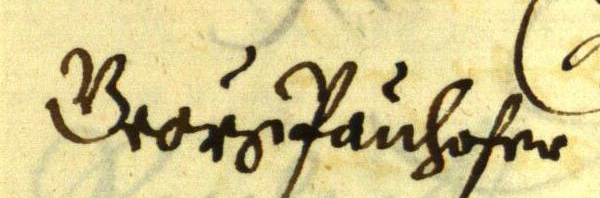Geōrg Paūhofer
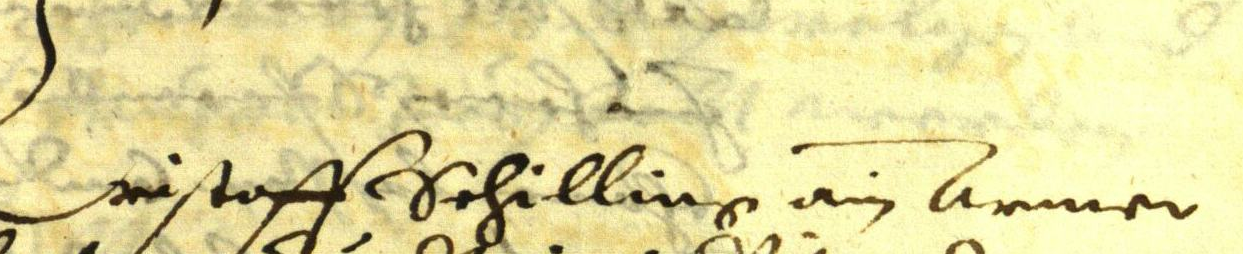Cristoff Schilling ain Armer
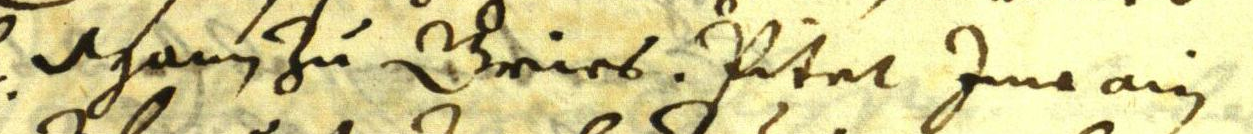Mann Zū Gries. Pitet Ime ain
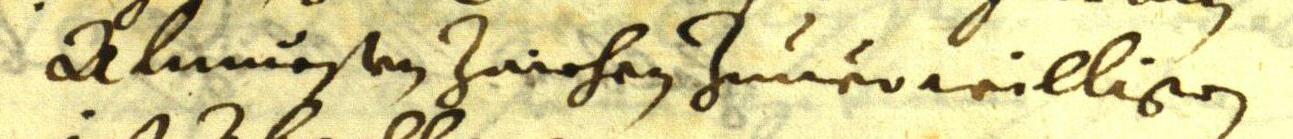Almūesen Zaichen Zūuērwilligen,
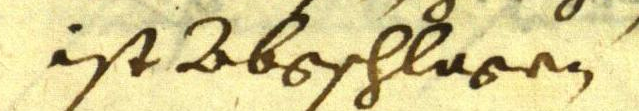ist Abgschlagen
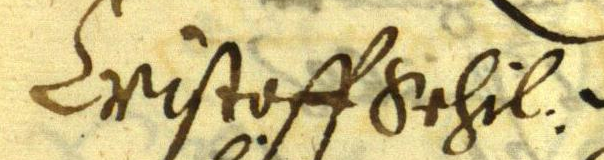Cristoff Schil¬
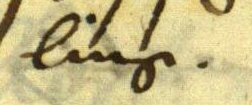ling.
